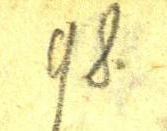98.
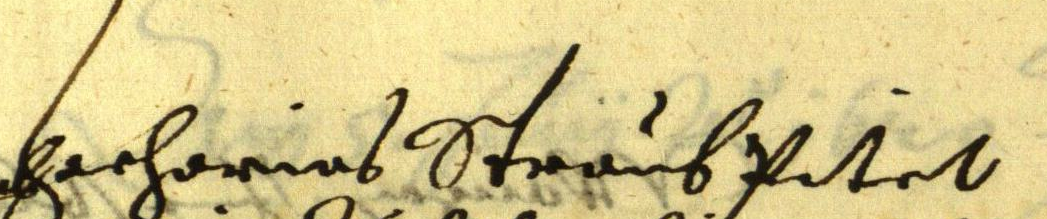Zacharias Straūb Pitet
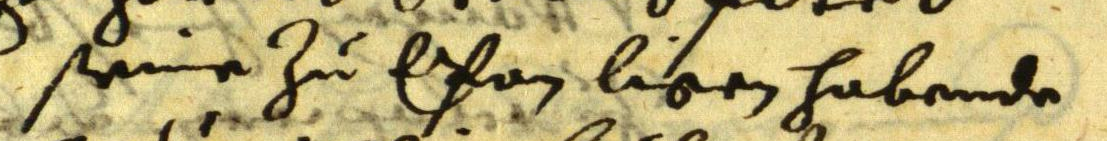seine Zū Epan ligen habende
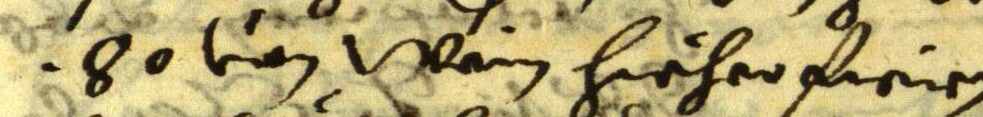.80 v̄rn Wein hieher fiern.
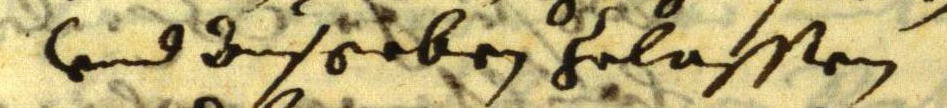vnd Aūsgeben Zelassen.
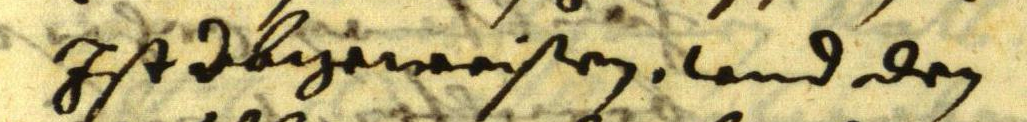Ist Abzeweisen. vnd den
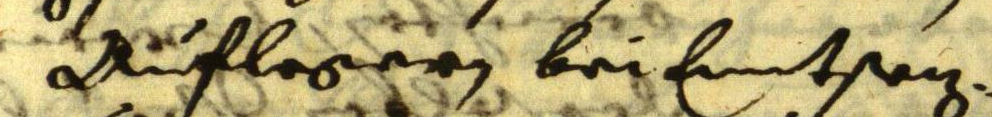Aūflegern bei Enntsez¬
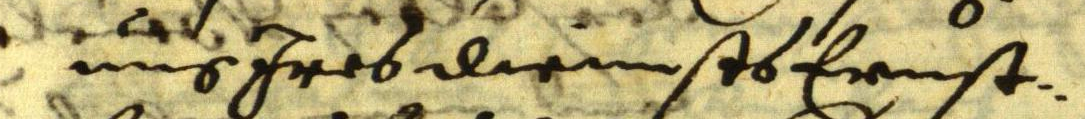ūng Ihres diennsts Ernst¬
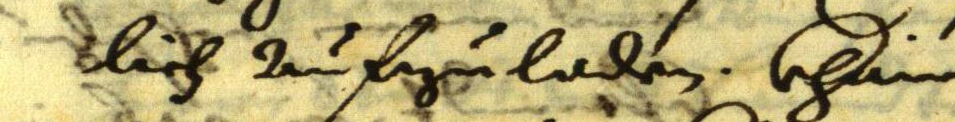lich Aūfzūladen. khainem
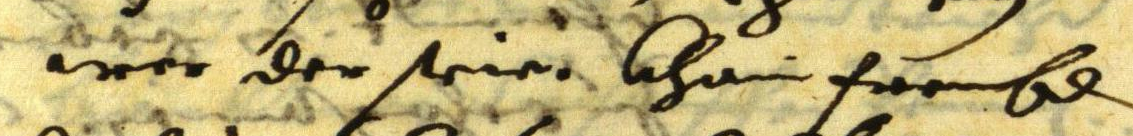wer der seie. khain frembd
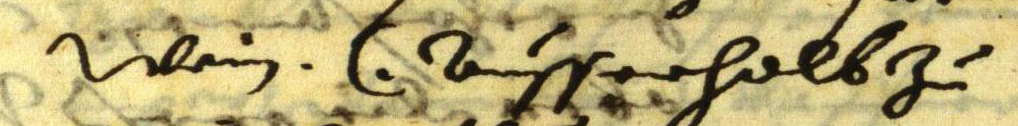Wein .(.Aūsserhalb Zū
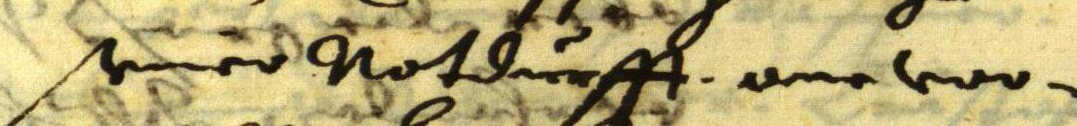Seiner Notdūrfft. one vor¬
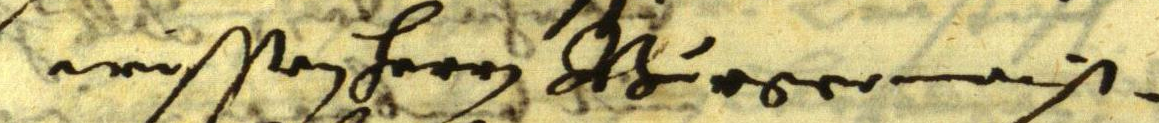wissen herrn Būrgermaist¬
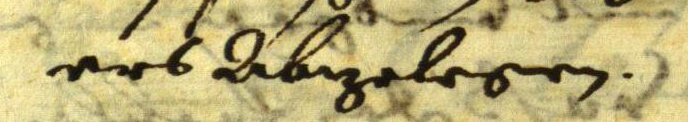ers Abzelegen.
